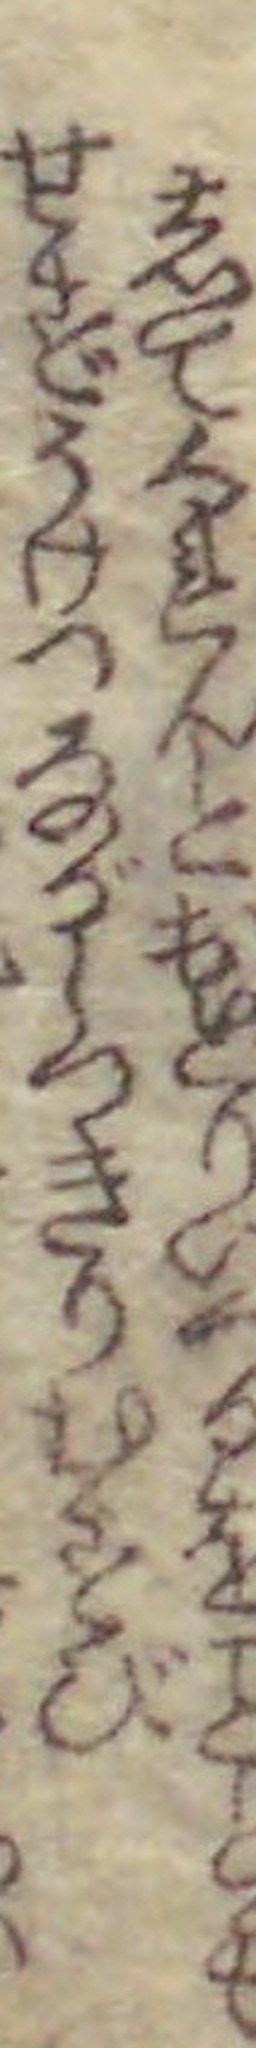せずうけつながしつきりむすび
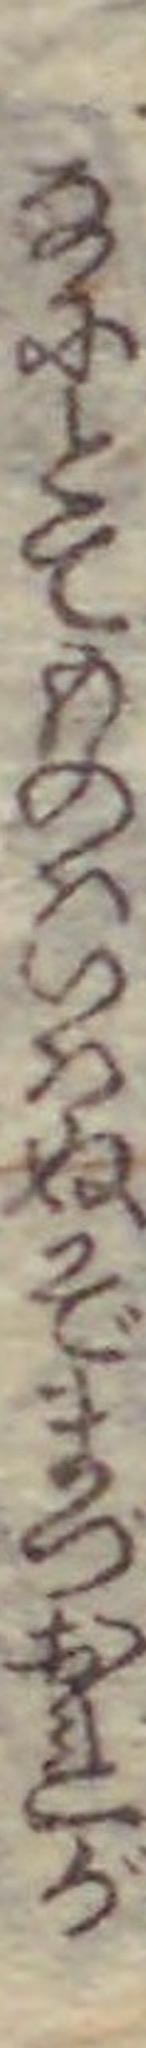なにとてものはいはぬぞまづおれが
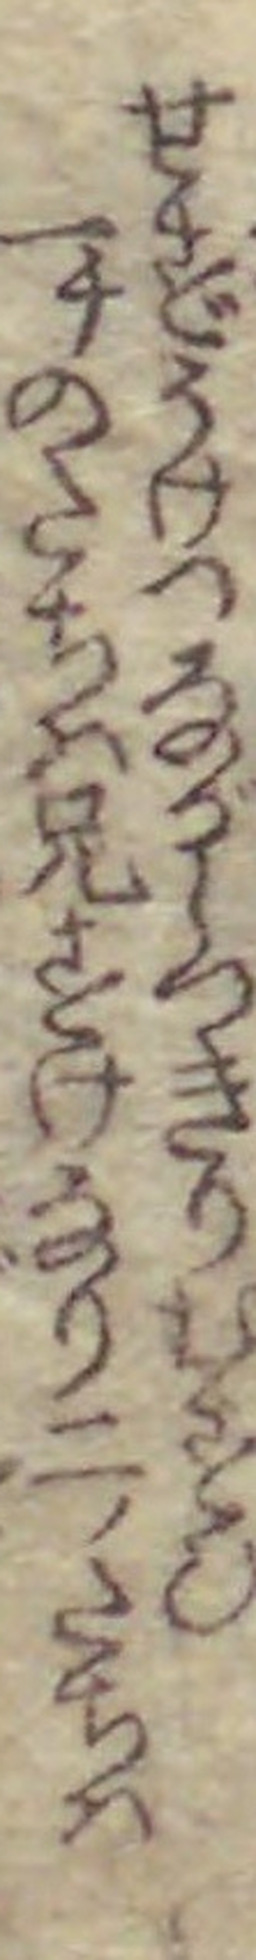一のたちは兄すけなり二のたちは
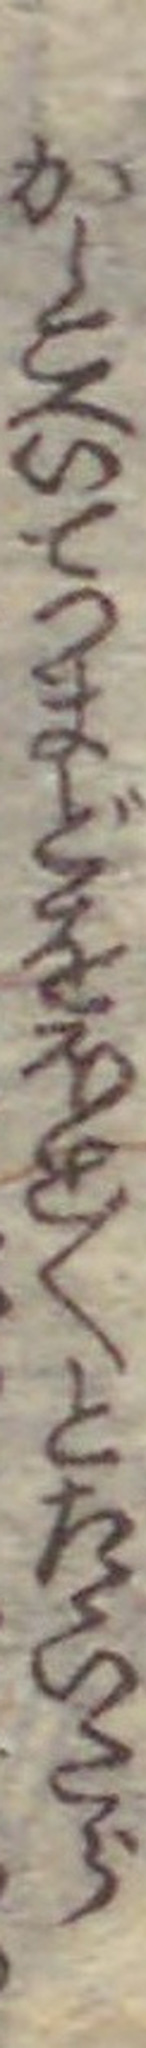かしこへいてつまどをほと〳〵とたゝいたら
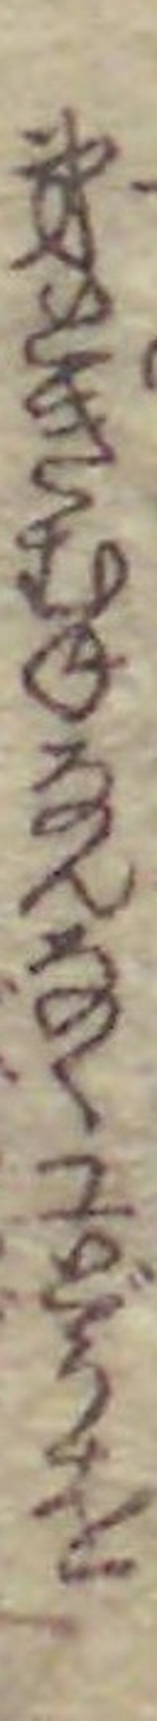弟ときむねなんなく工どうを
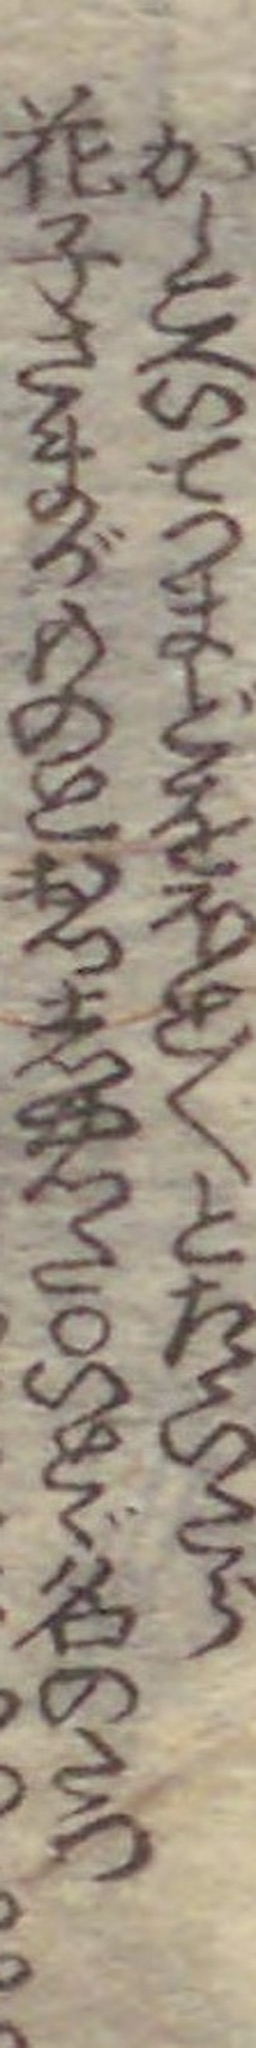花子さまがものとおつしやつた○いとゞ名のたつ
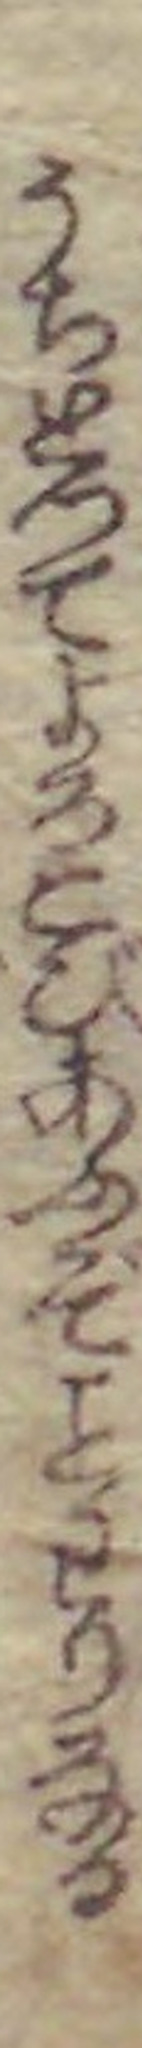うちとつてよろこびあふぞことわりなる
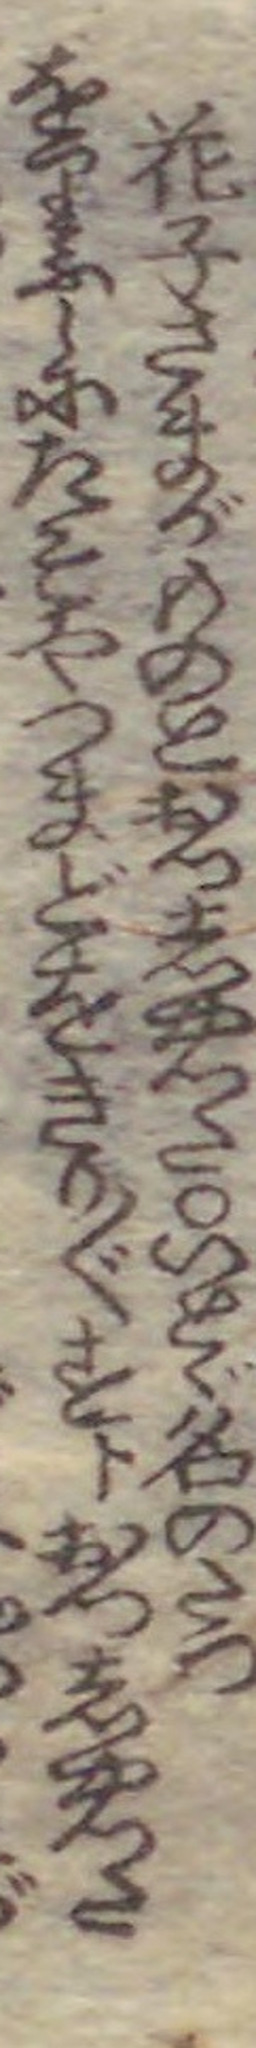おりふしにたそやつまどをきり〴〵すとおつしやつた
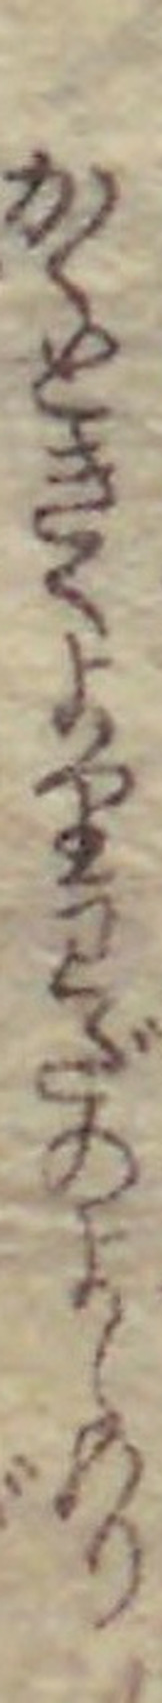かくときくよりわだのよしもり
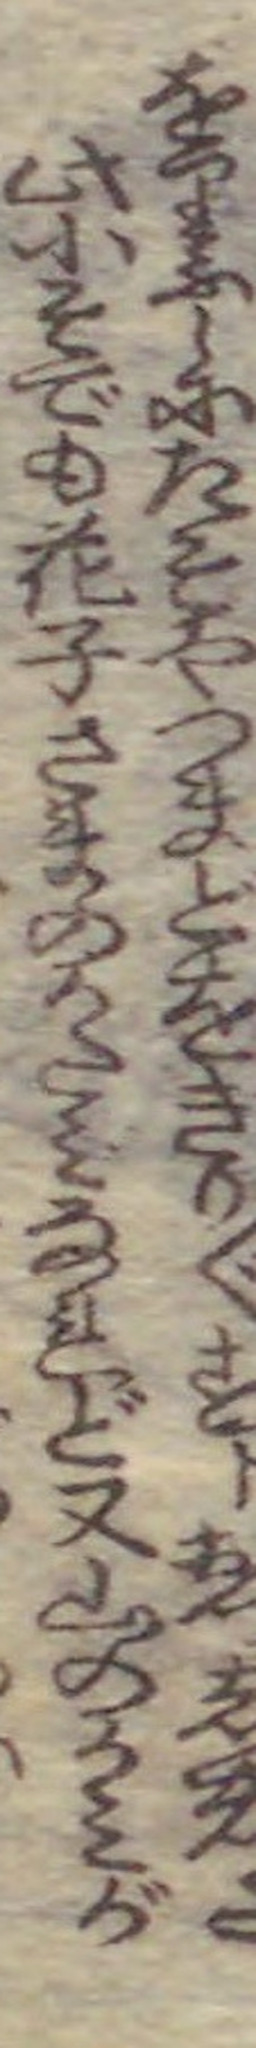此小そでも花子さまのかたみなるれど又山のかみが
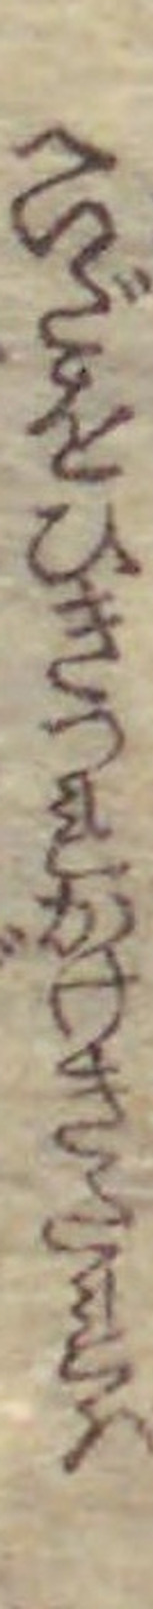へいだをひきつれかけきたれば
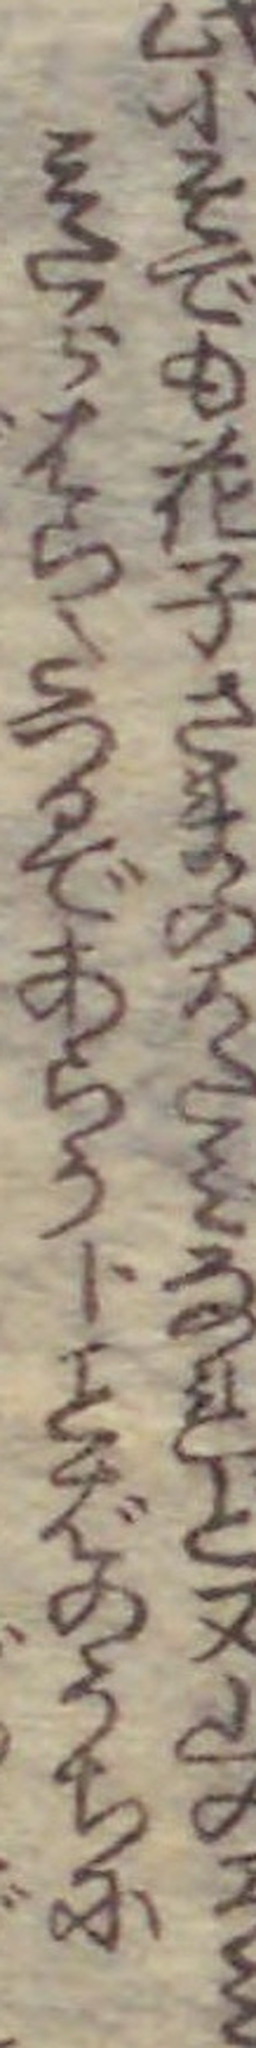みたらはらたつるであらうとことばのうちに
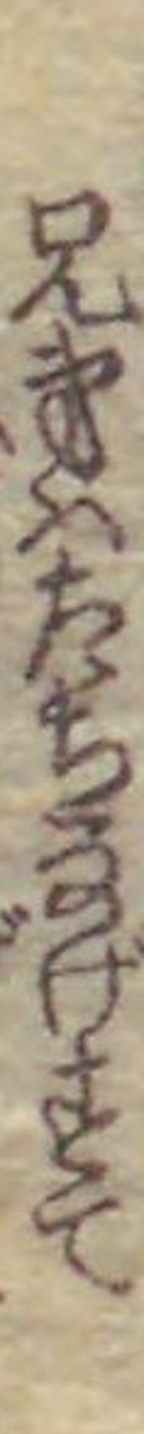兄弟はたちなげすて
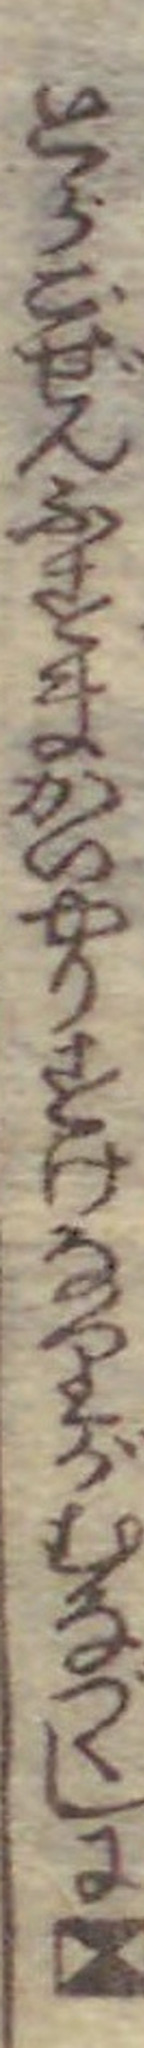とらごぜんふすまかいやりすけなりがむなづくしに▼▲
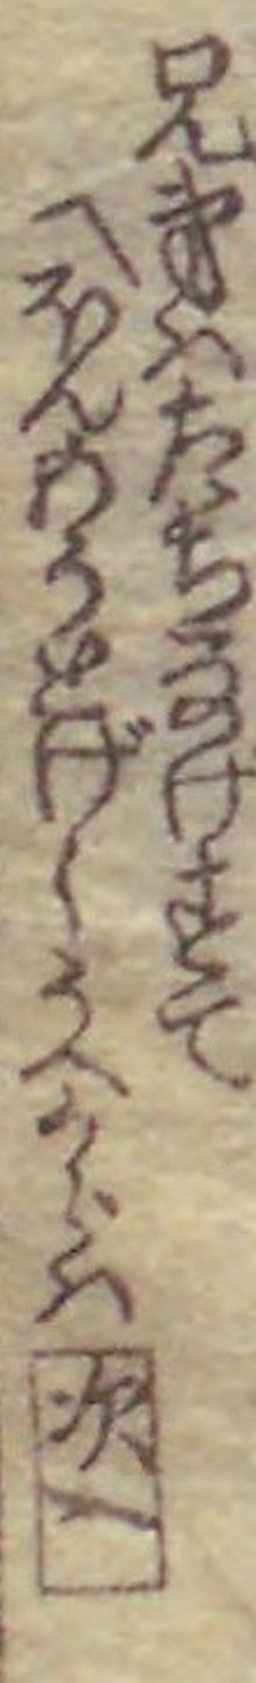〽ほんもうとげしうへからは次へ

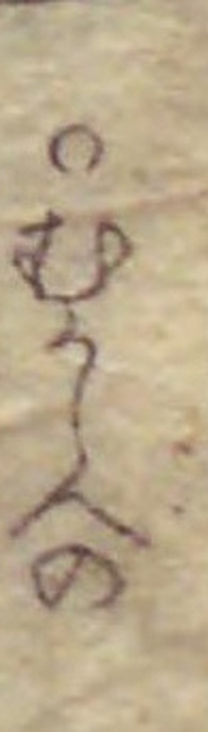○むかし人の
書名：大時代唐土化物 3巻. 曽我太夫染
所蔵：国立国会図書館 National Diet Library, JAPAN
